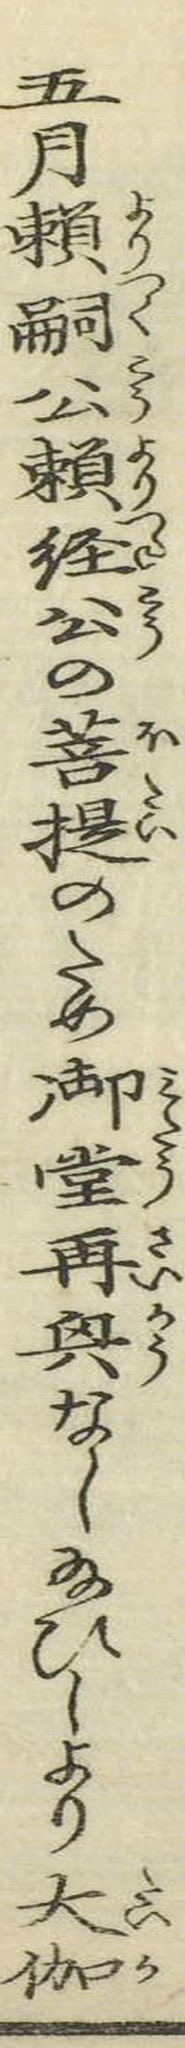五月頼嗣公頼経公の菩提のため御堂再興なし給ひしより大伽
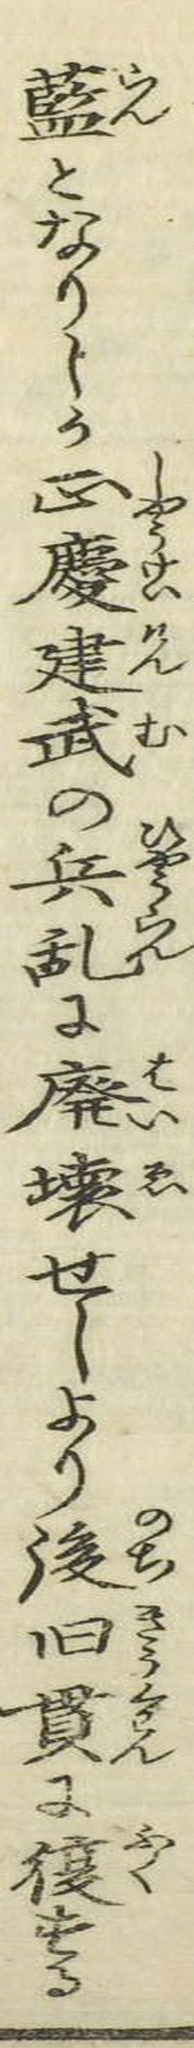藍となりしか正慶建武の兵乱に廃壊せしより後旧貫に復する
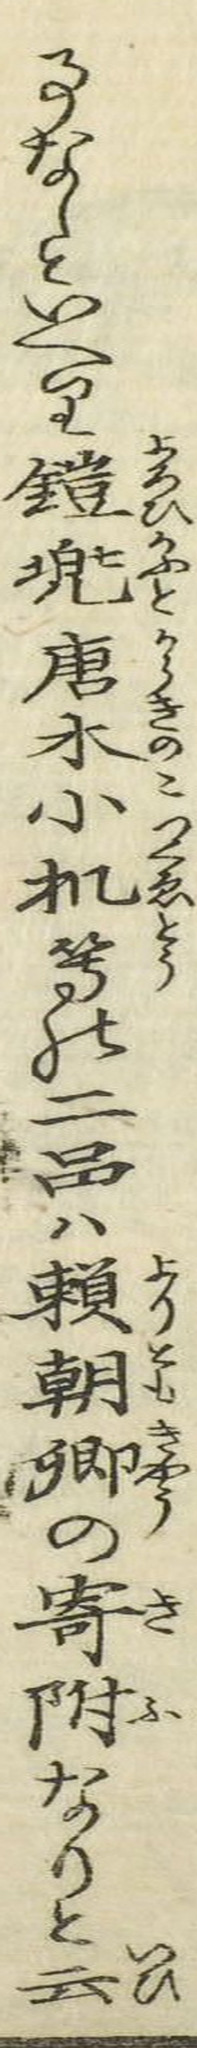事なしといへり鎧兜唐木小机等の二品は頼朝卿の寄附なりと云
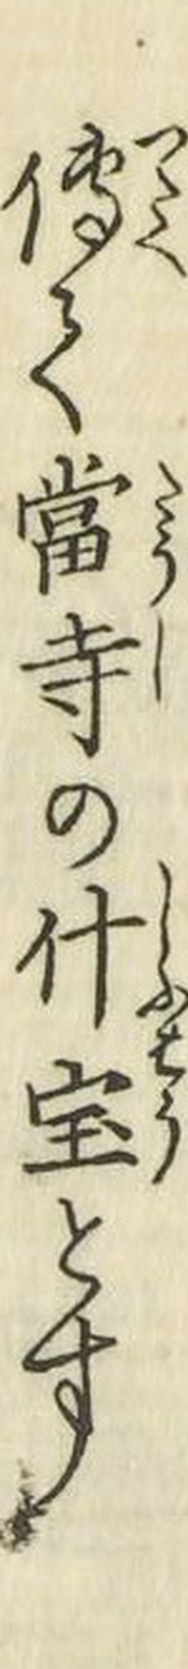伝て当寺の什宝とす
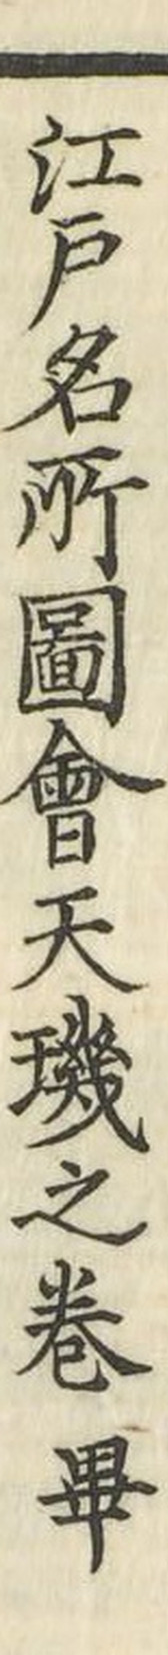江戸名所図絵天璣之巻畢
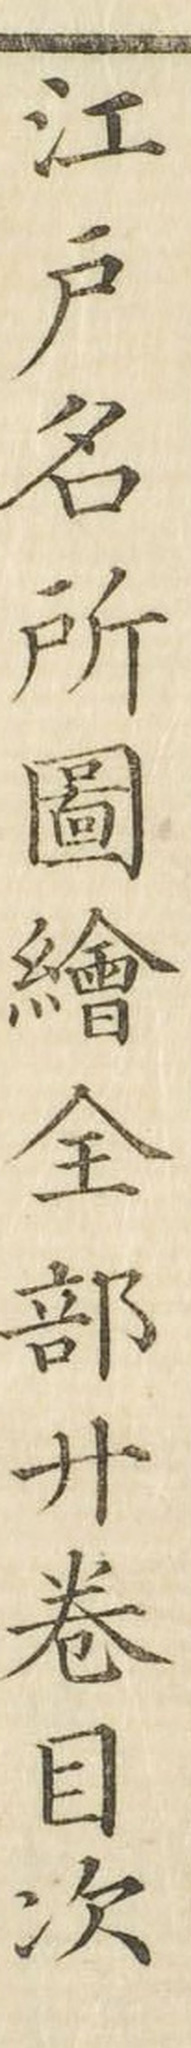江戸名所図会全部廿巻目次

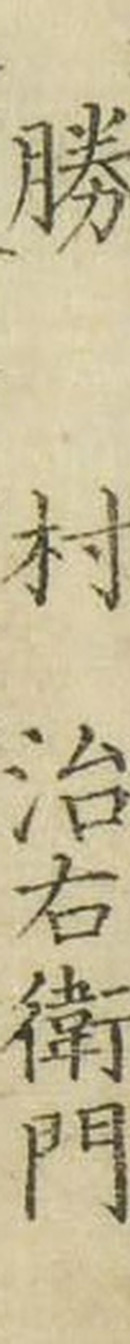勝村治右衛門
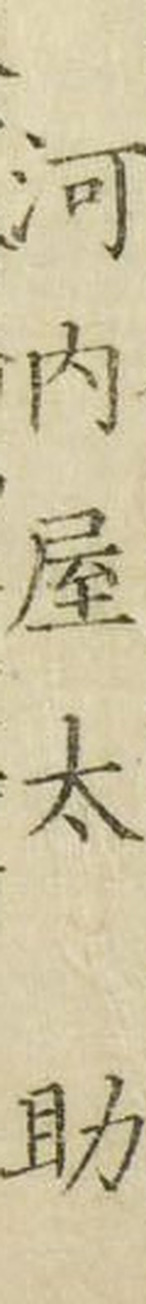河内屋太助
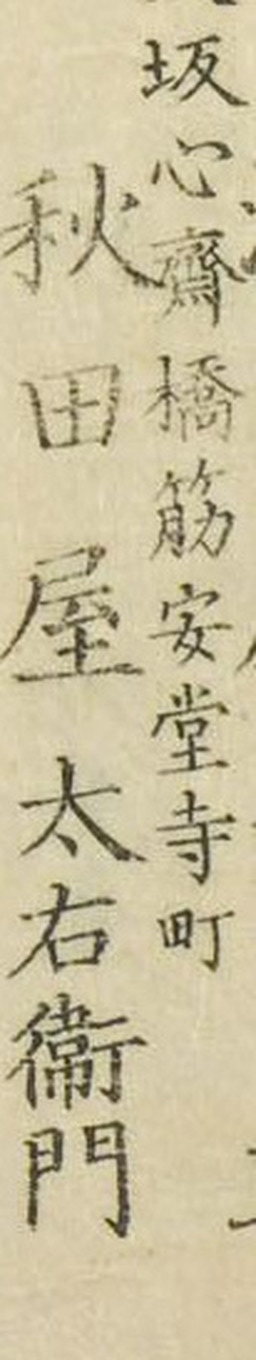秋田屋太右衛門
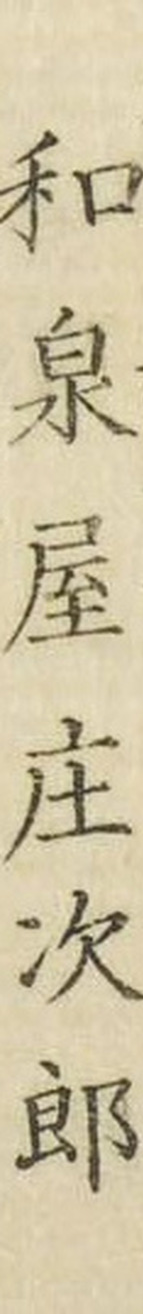和泉屋庄次郎
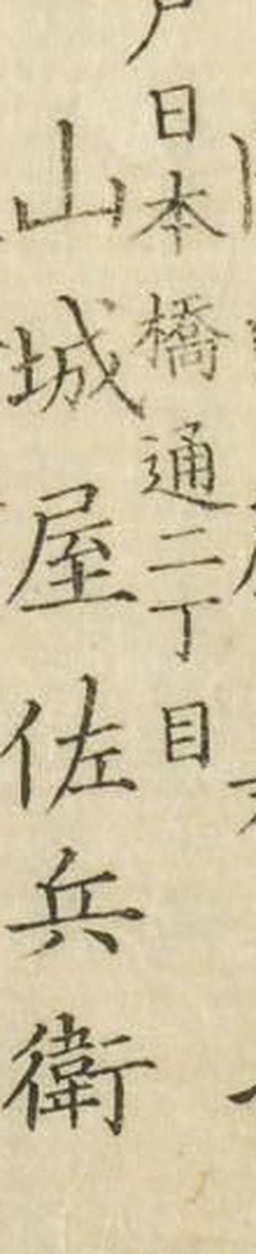山城屋佐兵衛
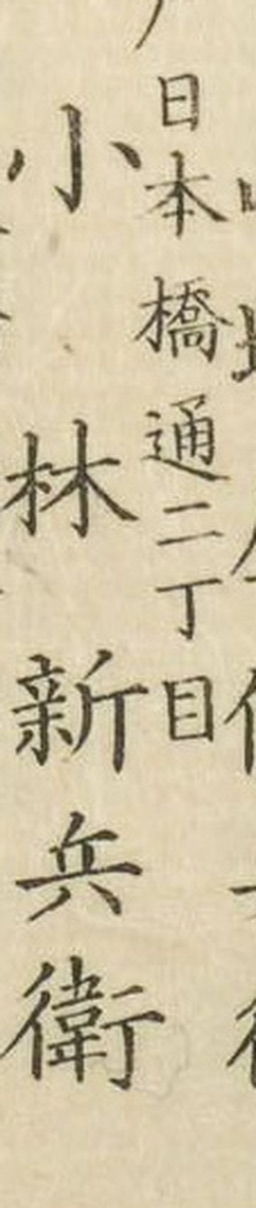小林新兵衛
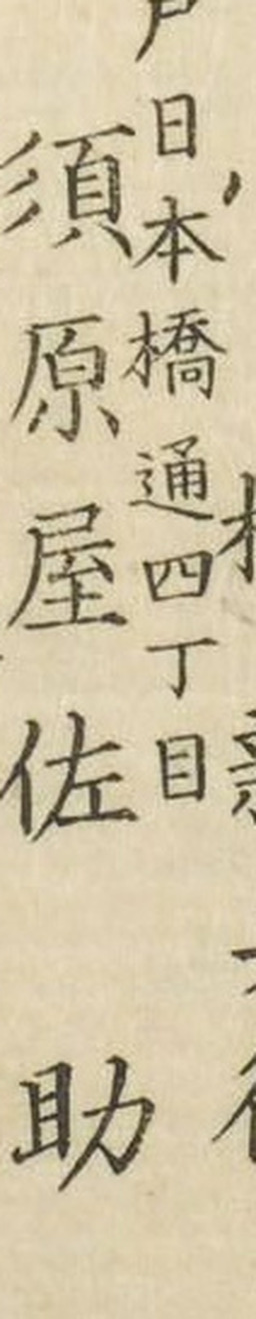須原屋佐助
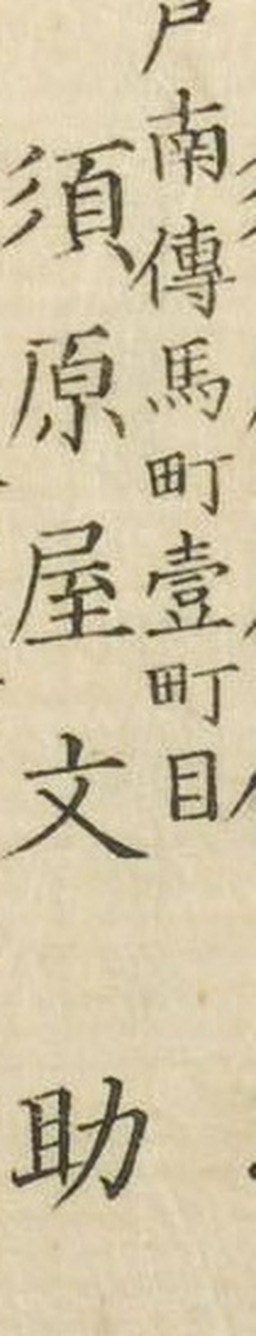須原屋文助
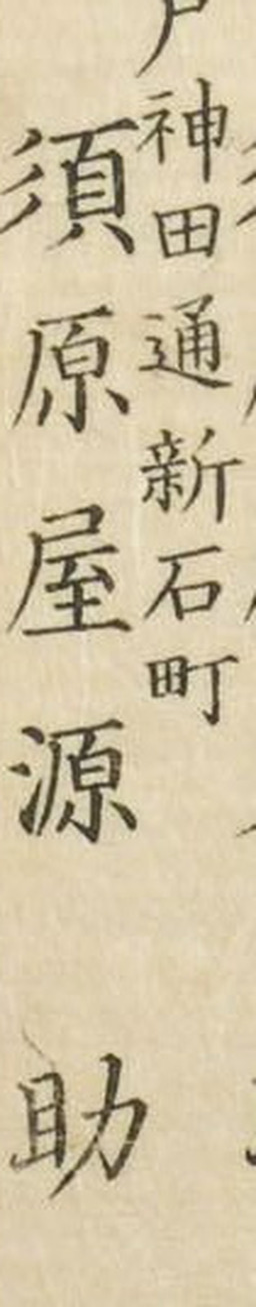須原屋源助
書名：江戸名所図会 20巻 巻之10
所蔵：東京学芸大学教育コンテンツアーカイブ
